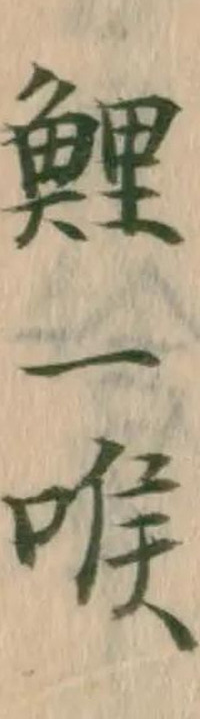鯉一喉
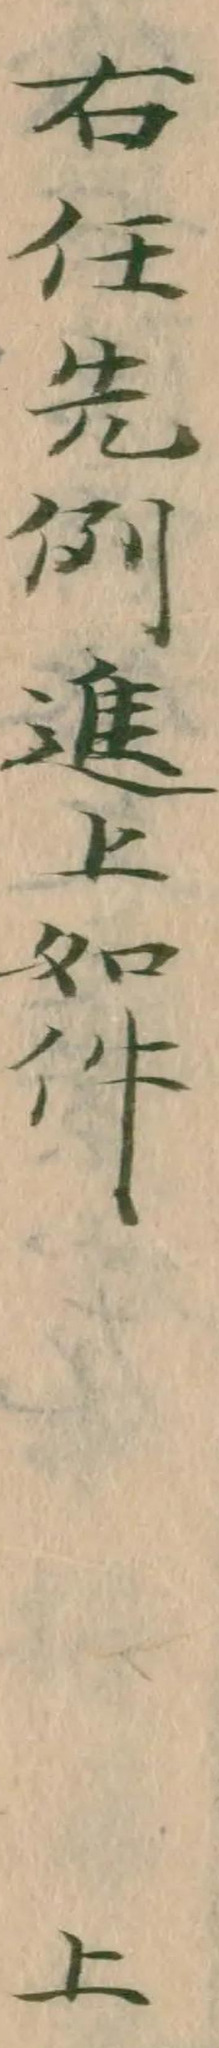右任先例進上如件上
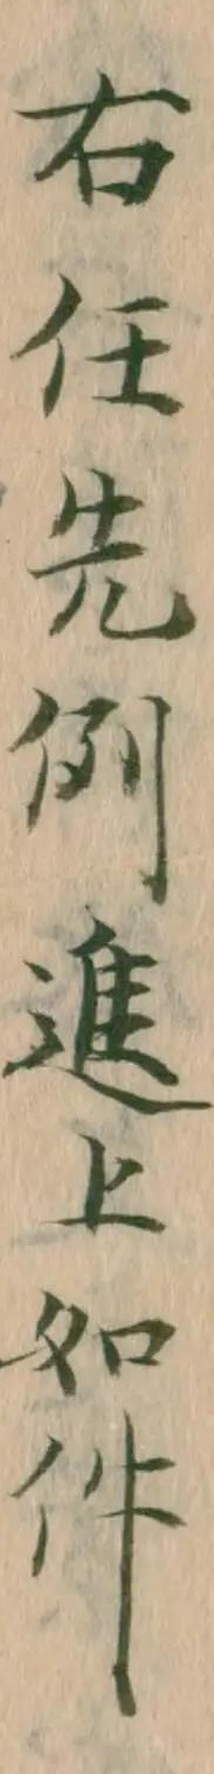右任先例進上如件上
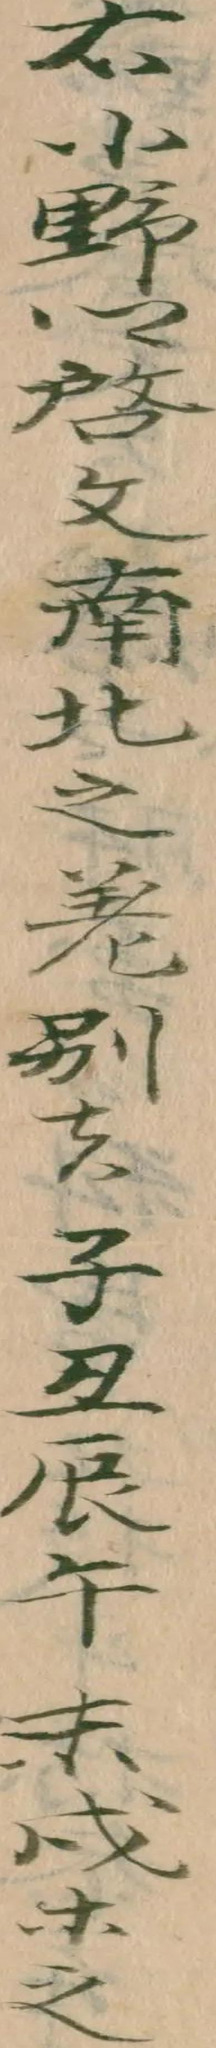右小野郷啓文南北之差別は子丑辰午未戌等之
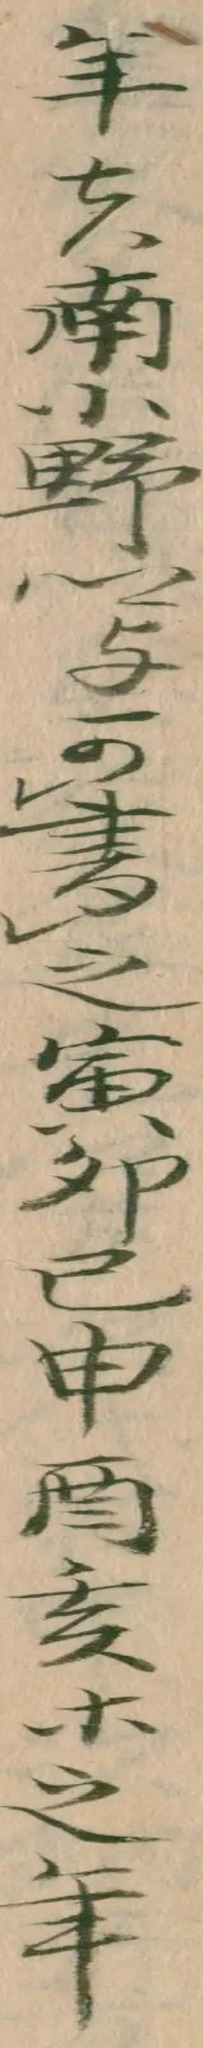年は南小野郷与可書之寅卯已申酉亥等之年
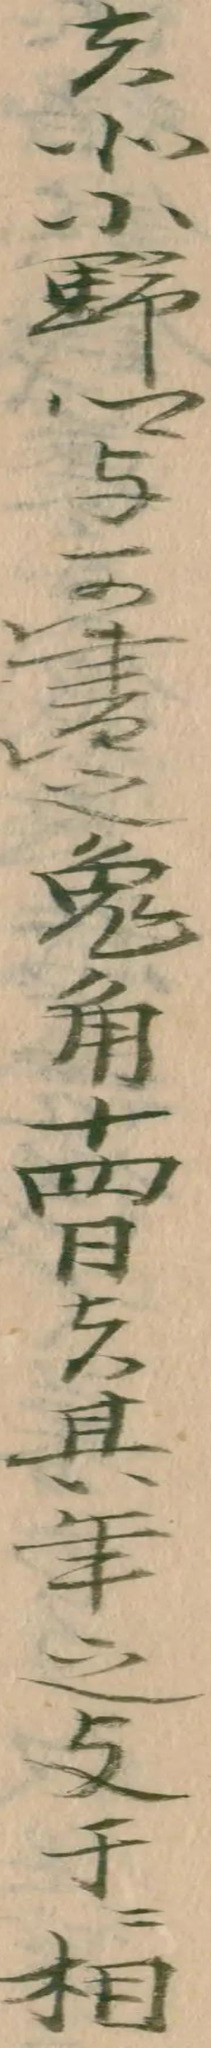は北小野郷与可書之兎角十四日は其年之支干ニ相
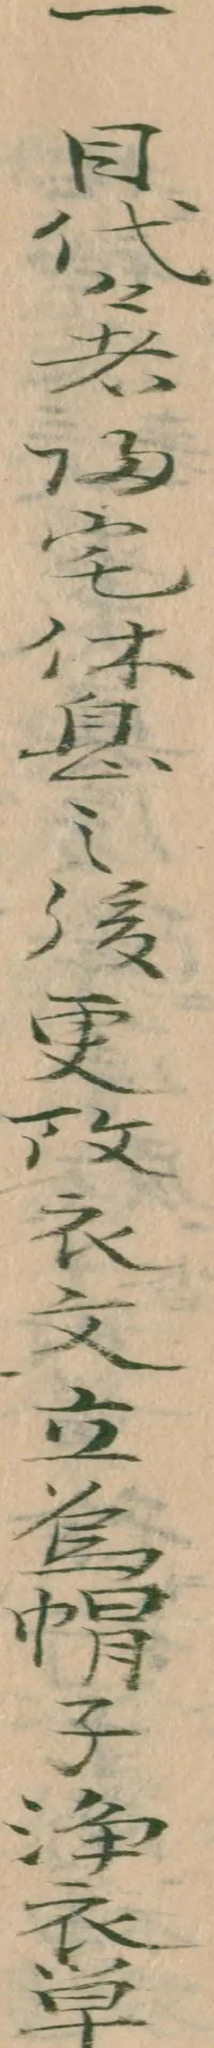一目代々は帰宅休息之後更改衣文立烏帽子浄衣単
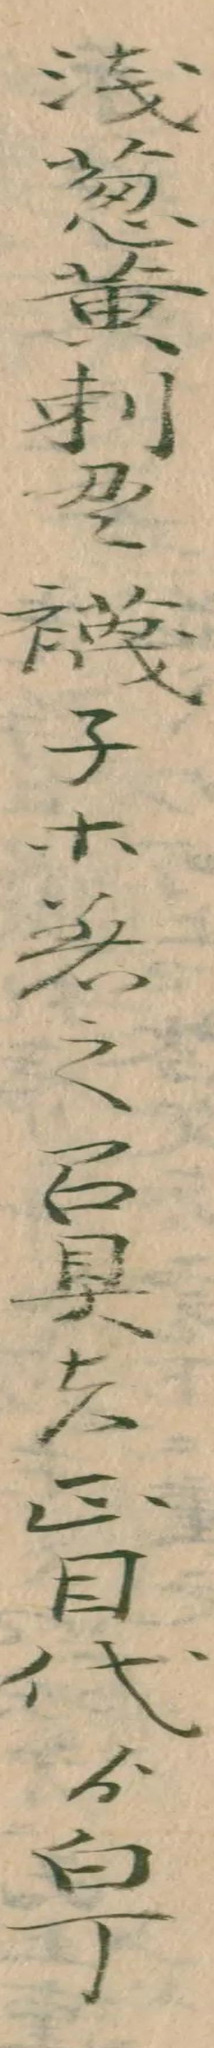浅葱黄刺貫襪子等着之召具は正目代ゟ白丁
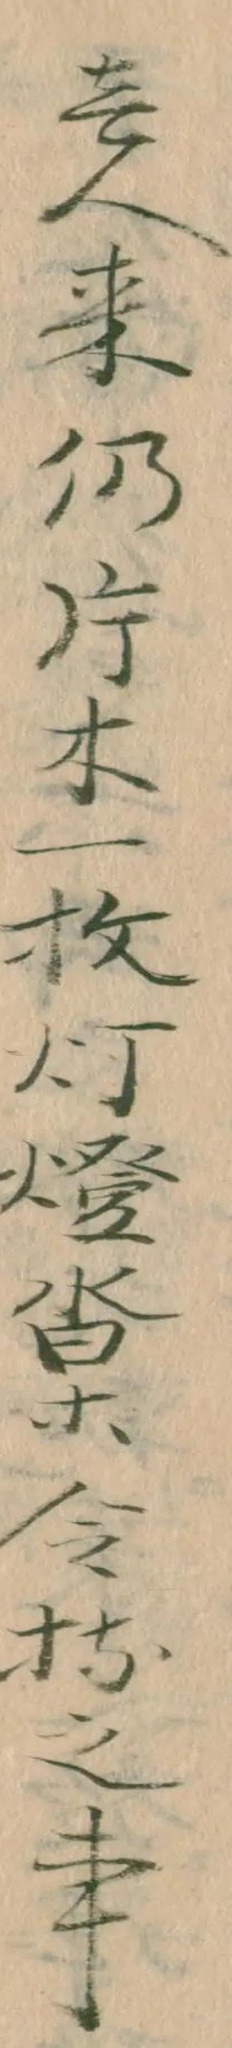壱人来仍片木一枚灯燈沓等令持之事
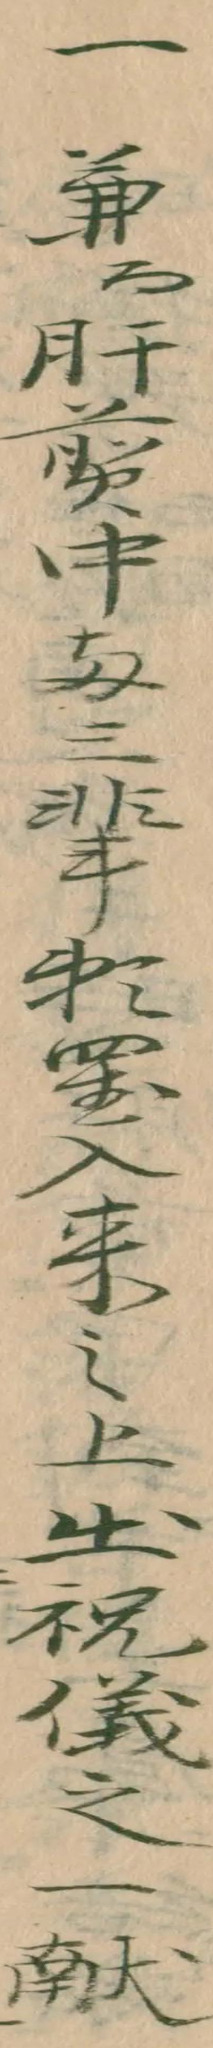一兼而肝煎中両三輩頼置入来之上出祝儀之一献
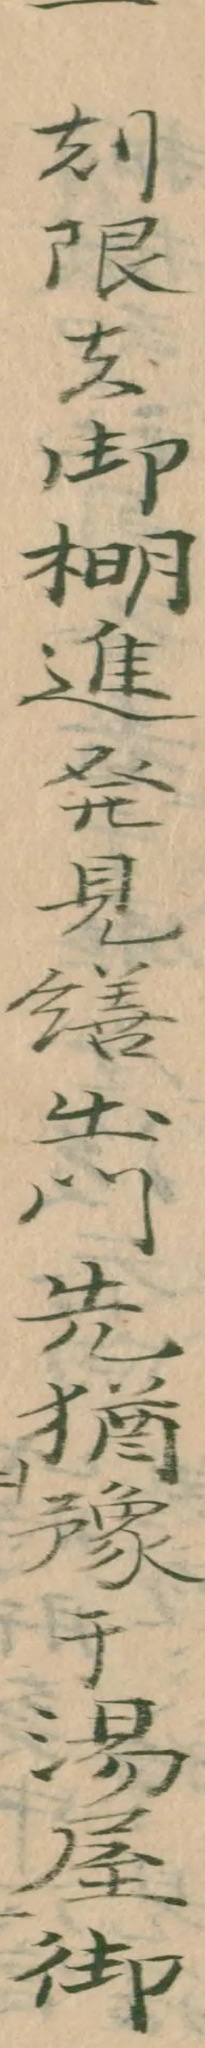一刻限は御棚進発見繕出門先猶-予于湯屋御

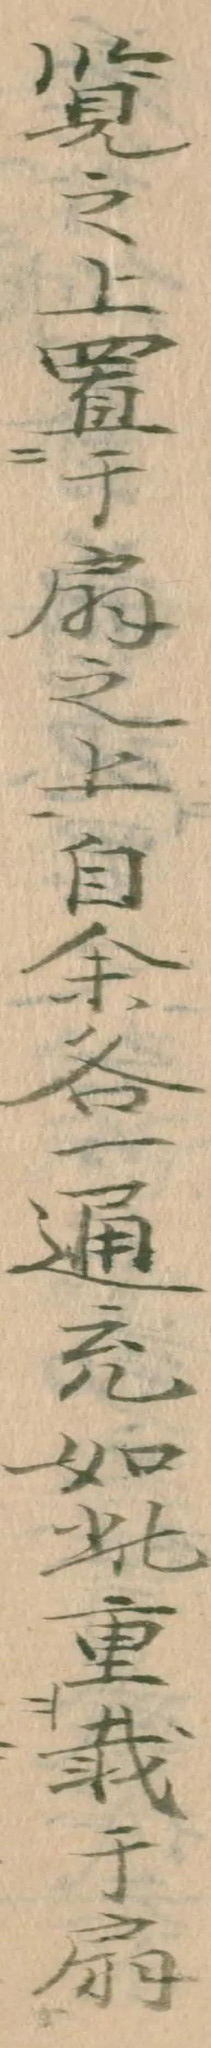覧之上置于扇之上自余各一通充如此重-載于扇
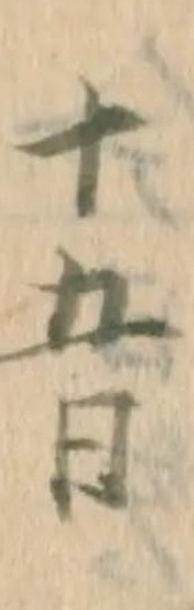十五日

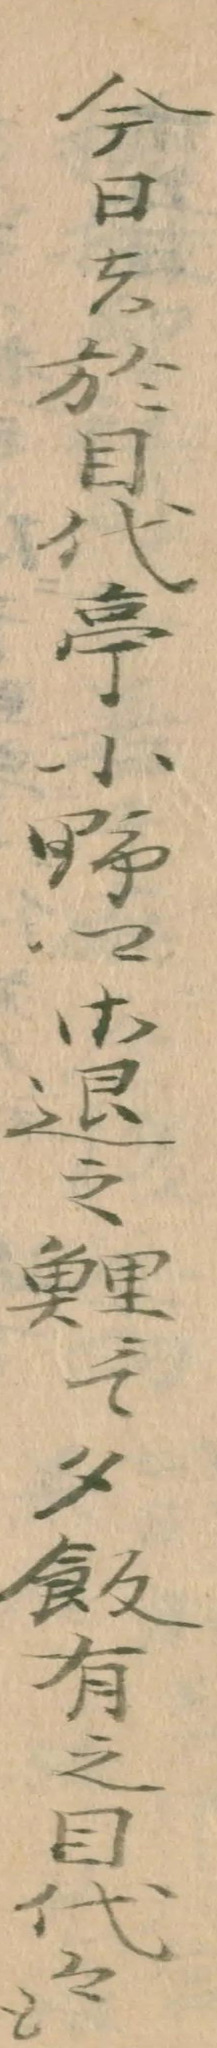一今日は於目代亭小野郷御退之鯉ニて夕飯有之目代々も
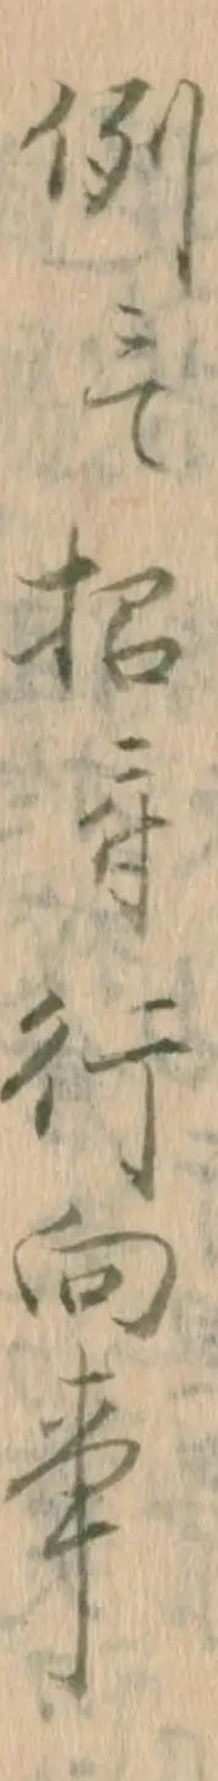例ニて招ニ付行向事
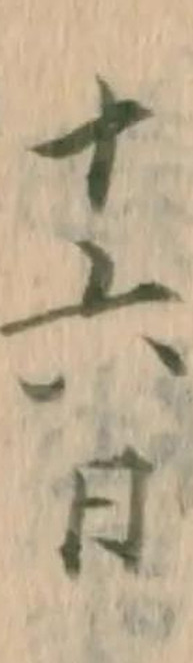十六日
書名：賀茂社記録. 第26冊
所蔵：国立国会図書館 National Diet Library, JAPAN
